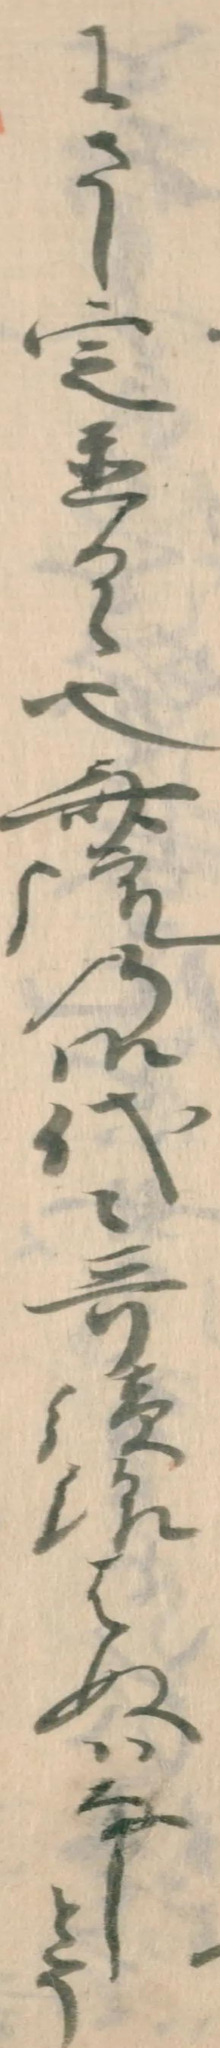にさし定置るゝ也斎院の御代々哥読給はぬはなしとそ
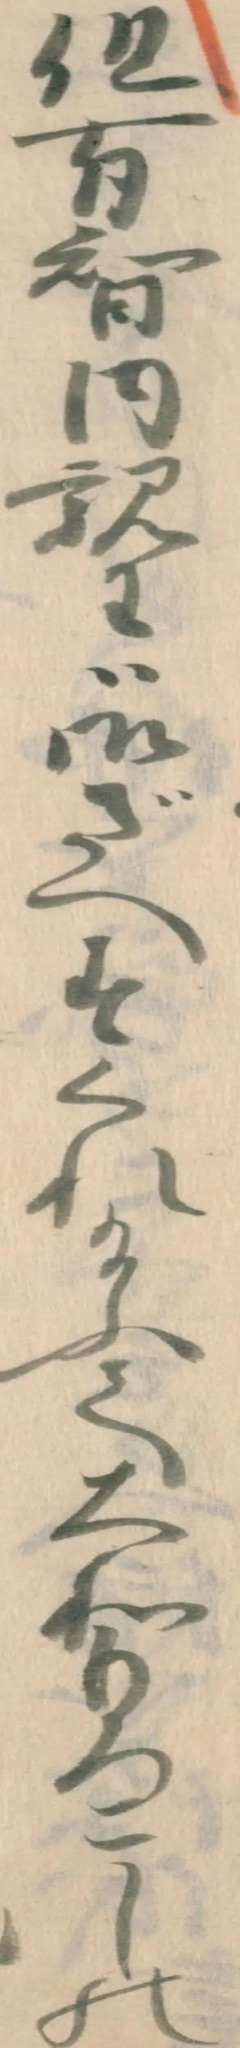但有智内親王は御ざへすくれ給ふて大和もろこしの
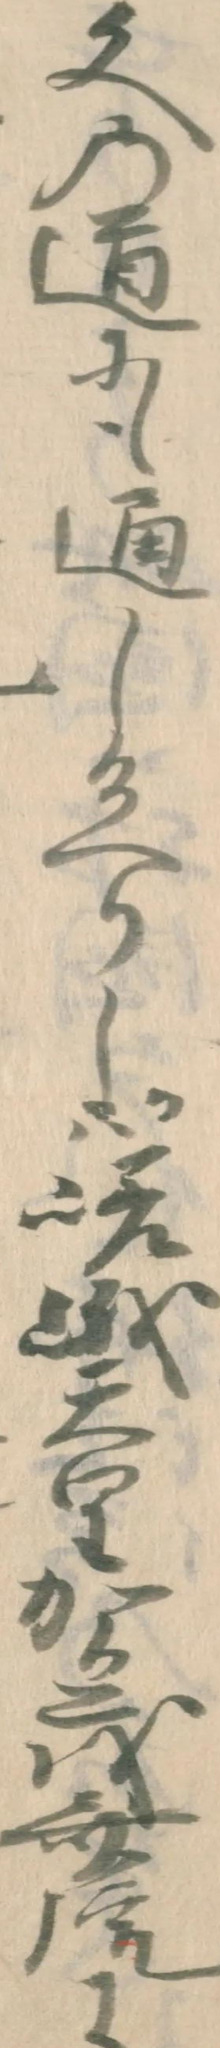文の道にも通し給へりし◦は嵯峨天皇賀茂斎院に

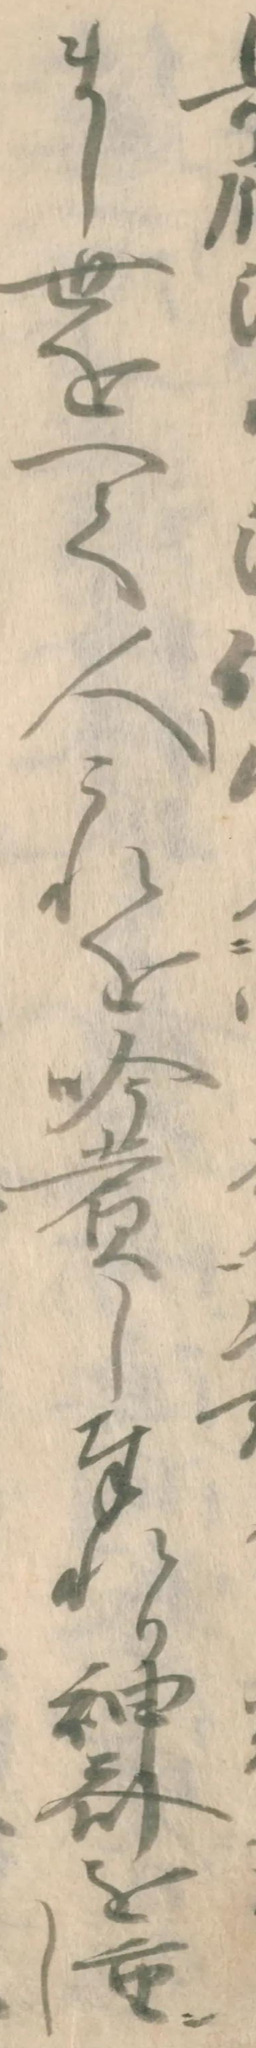まし世をへて人これを吟賞し奉れり神斎を重
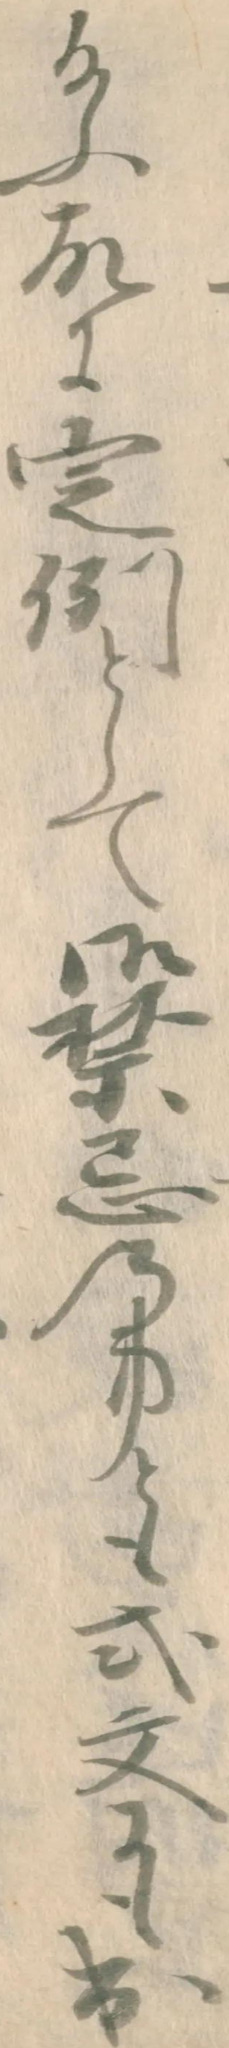給ふ故に定例として御禁忌の事とも式文にも出
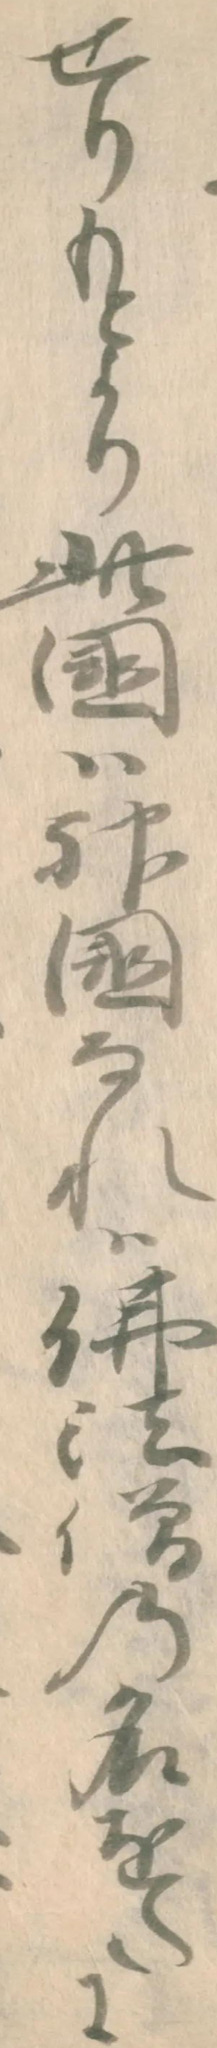せりもとより此国は神国なれは仏法僧の名をたに
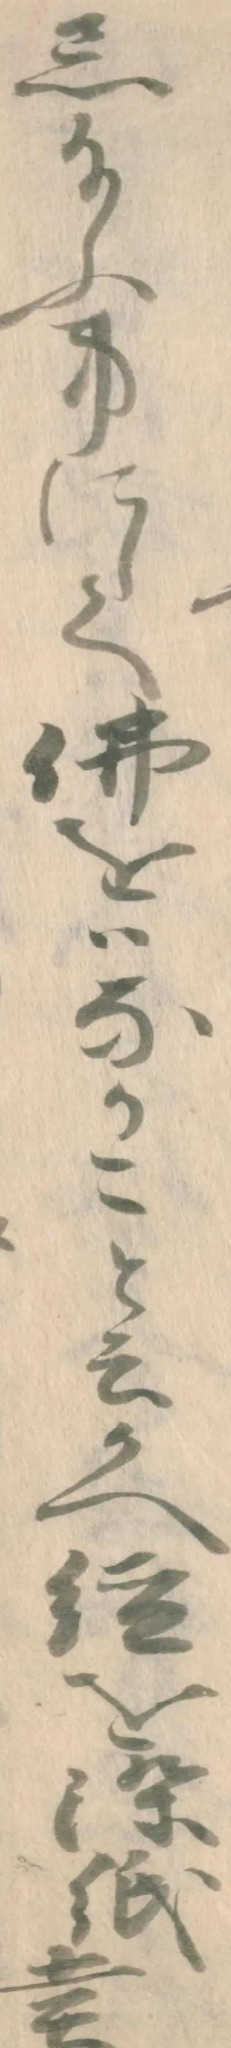忌給ふ事にして仏をはなかこと云かへ経を染紙堂
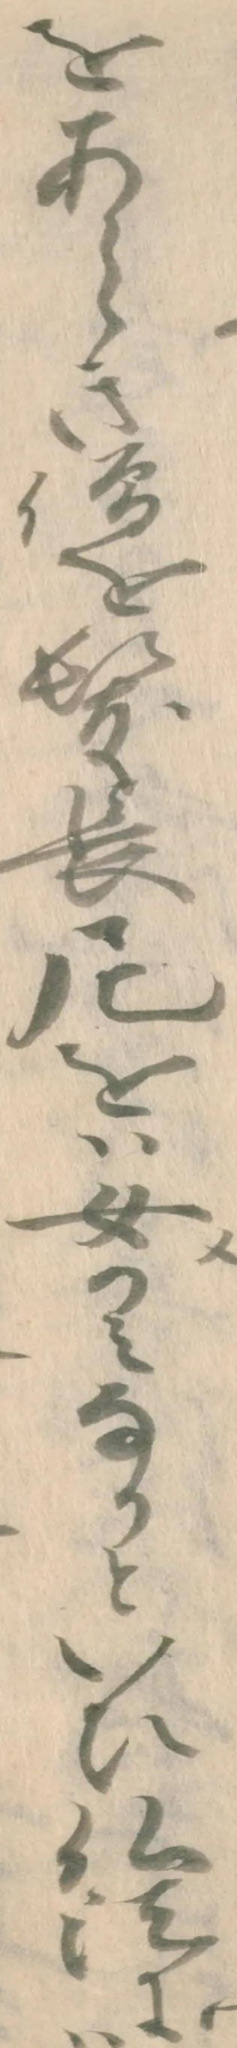をあらゝき僧を髪長尼をは女かみなかといひ仏法には
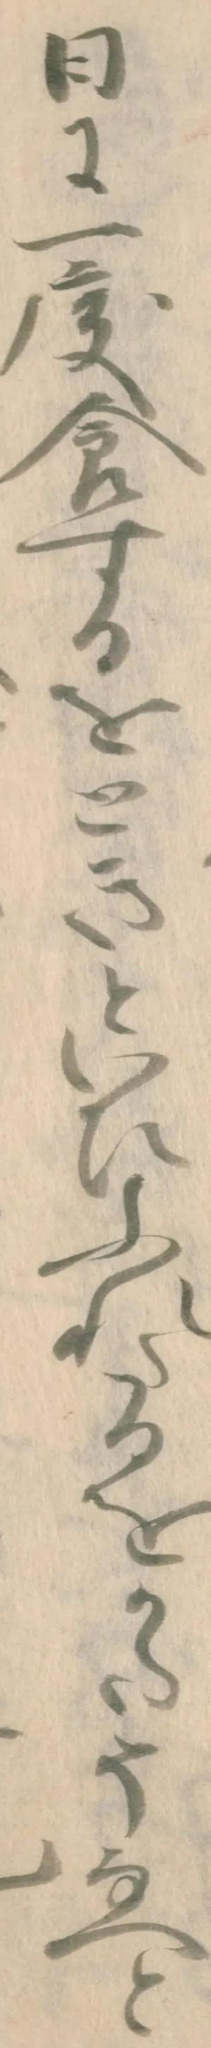日に一度食するをときといひふれたるをかたそなへと
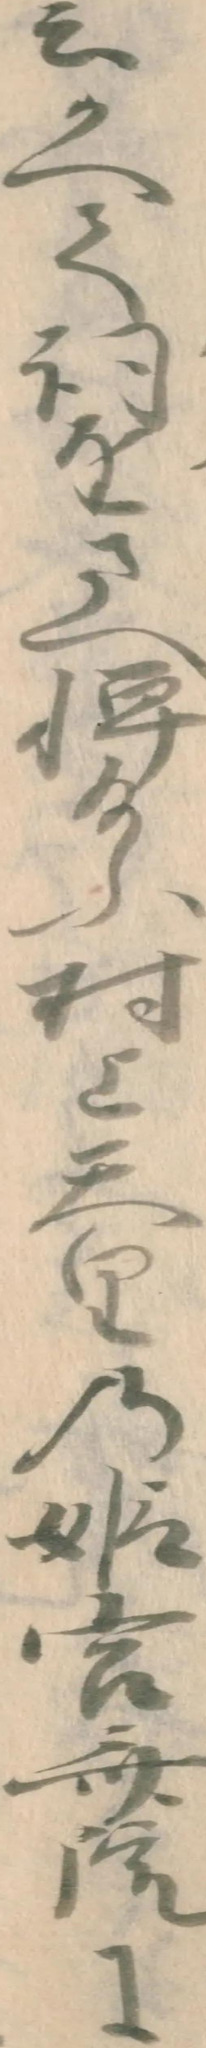云かへて詞をさへ憚給ふ村上天皇の姫宮斎院に
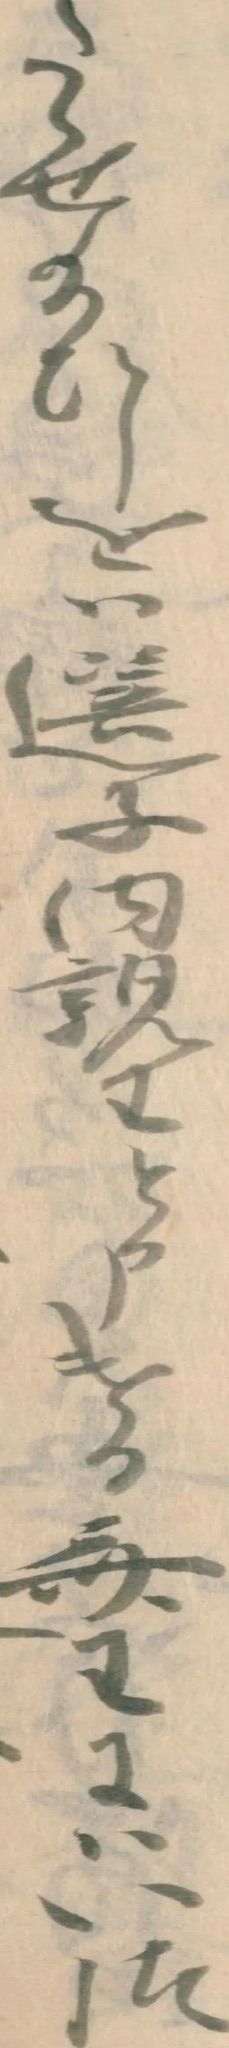たゝせ給ひしをは選子内親王と申ける斎王にはいつ
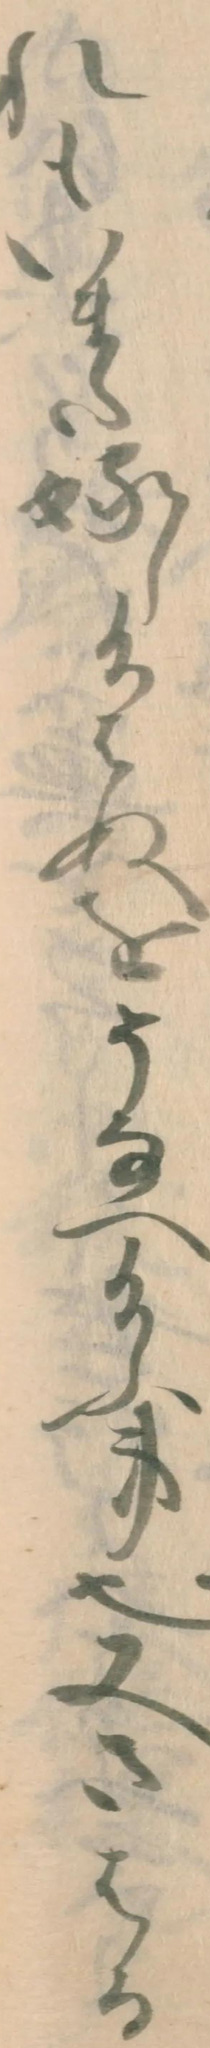れもいまた嫁給はぬをそなへ給ふ事也又さはる
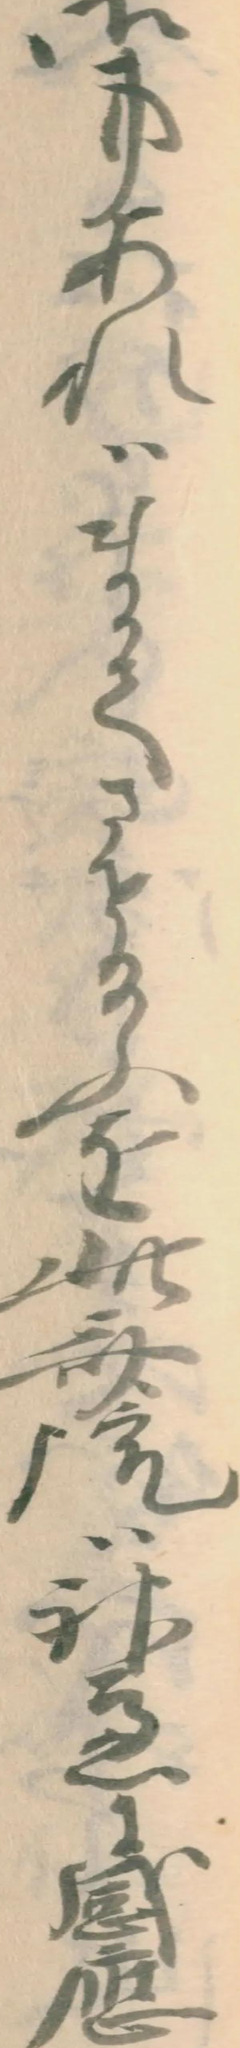御事あれはまかてさせ給ふを此斎院は神慮に感応
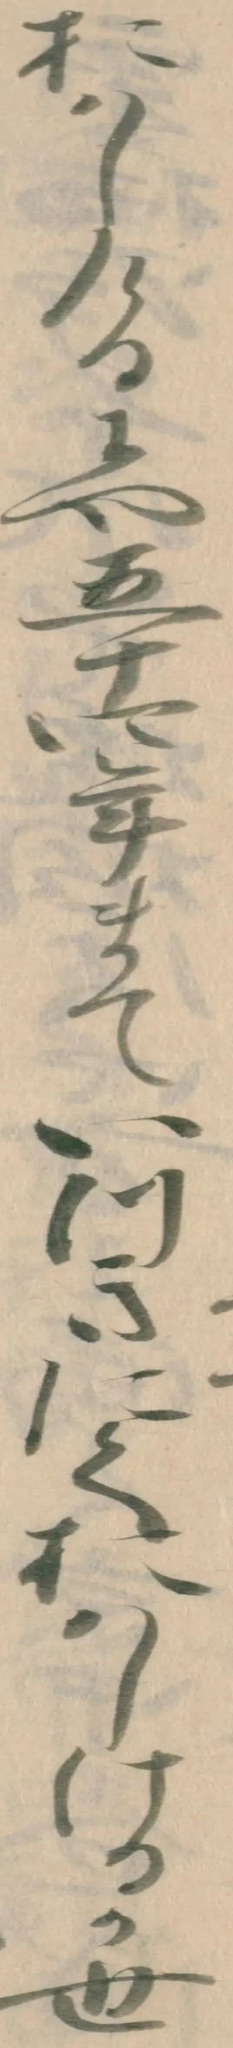おはしけるにや五十四年まていつきにておはしけるか世
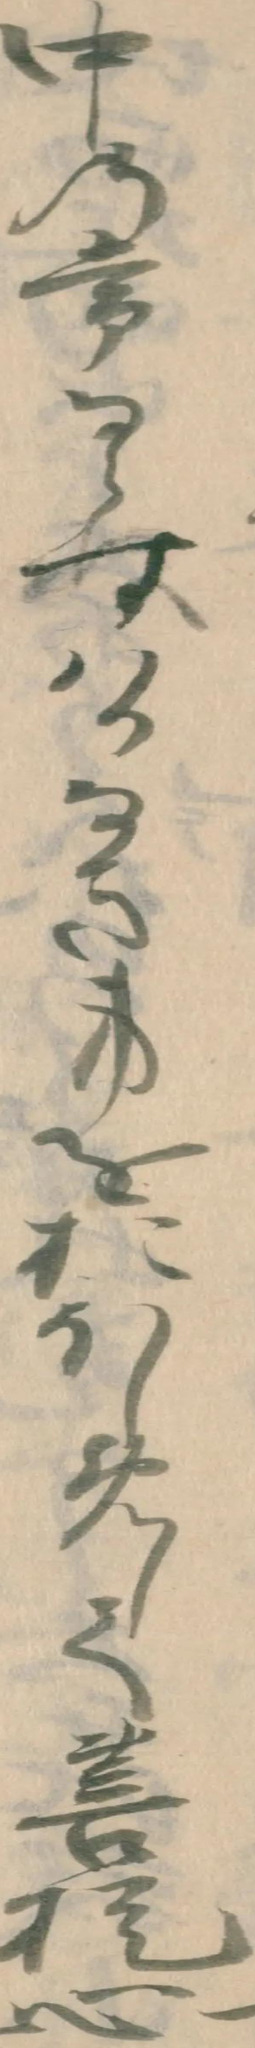中の常ならすはかなき事をおほしめして菩提心を
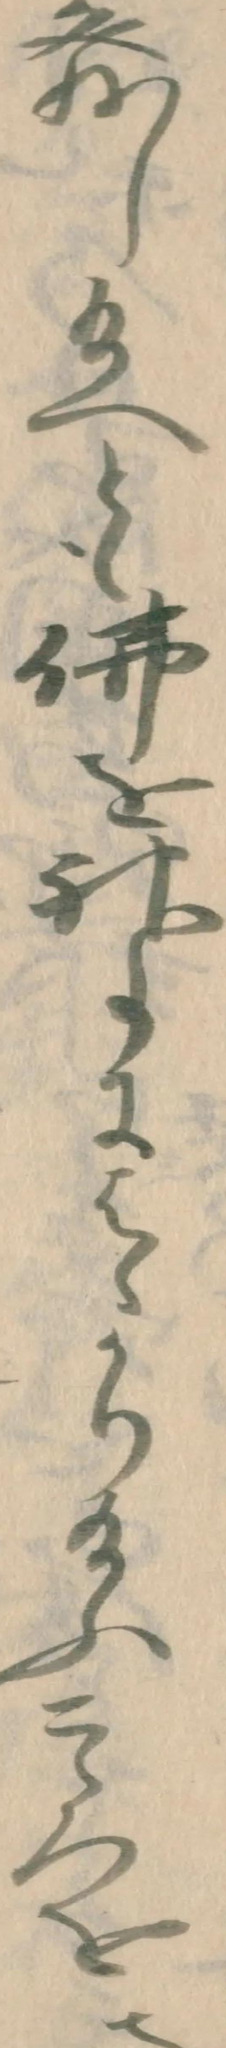発し給へとも仏を神事にはゝかり給ふこゝろを
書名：賀茂社記録. 第1冊
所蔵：国立国会図書館 National Diet Library, JAPAN
